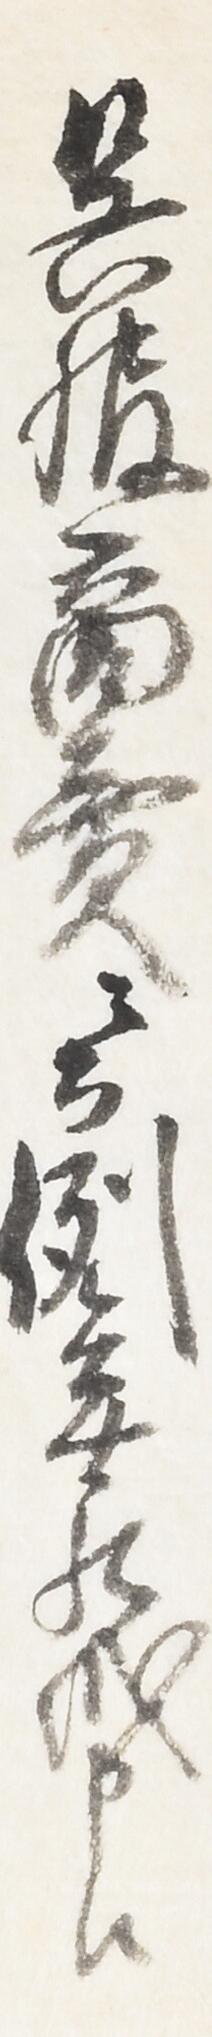呉服商売ニ而例年罷越申候
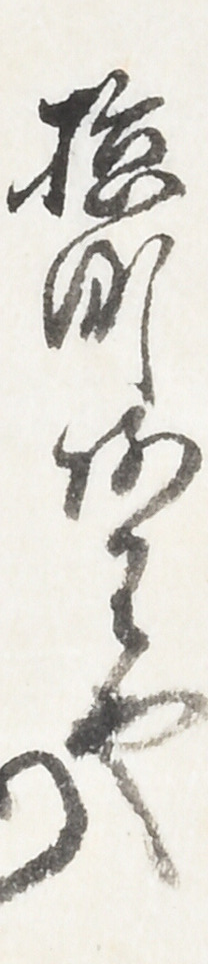横町あわや
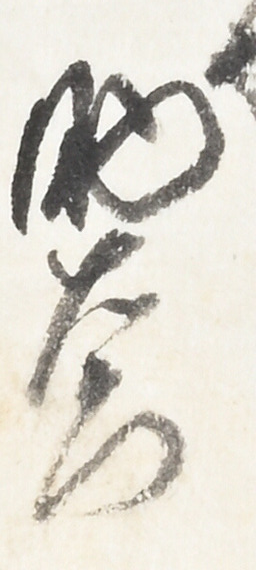助右衛門
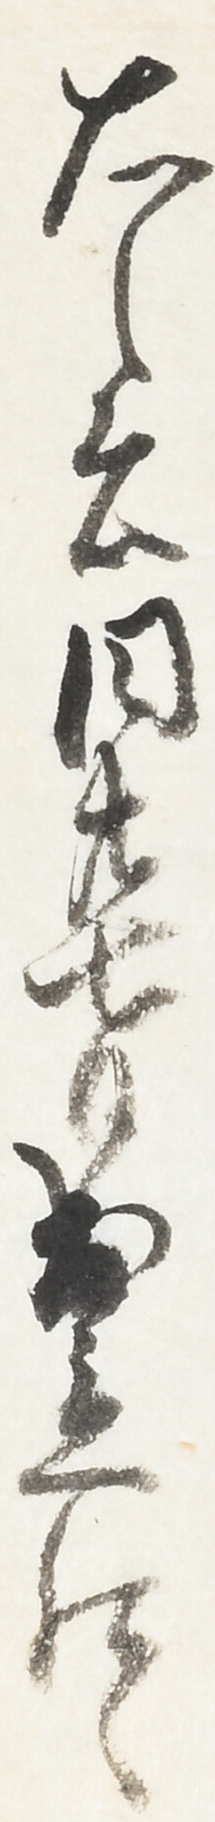右之者同廿七日出立仕候
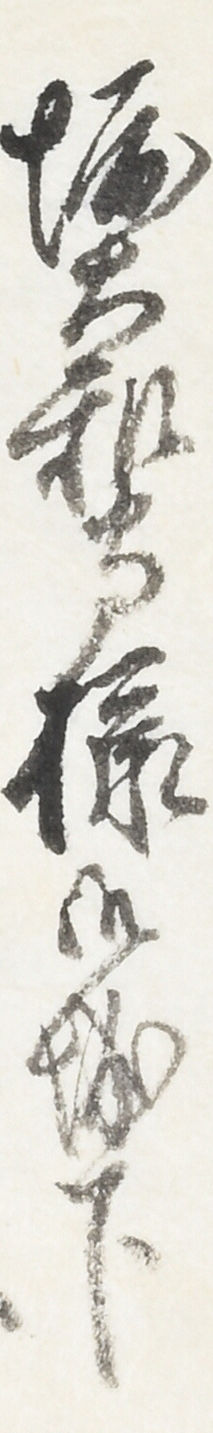堀大和守様御城下
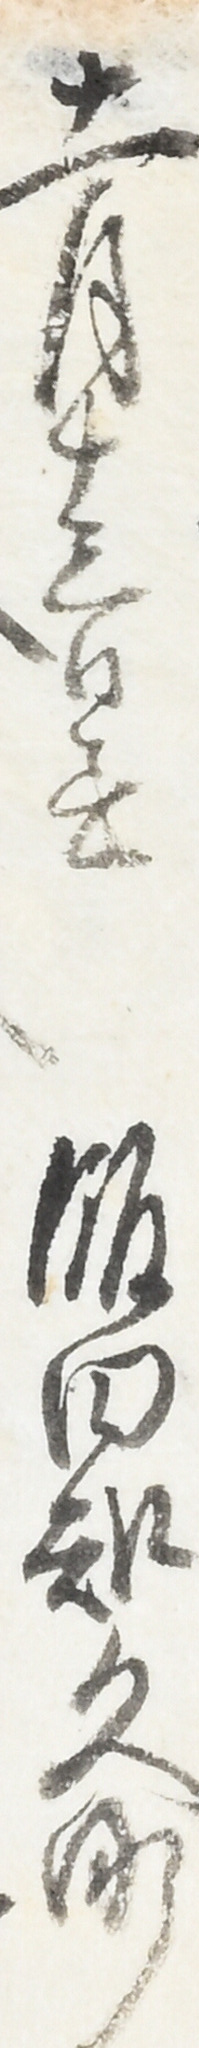十一月十三日着飯田知久町
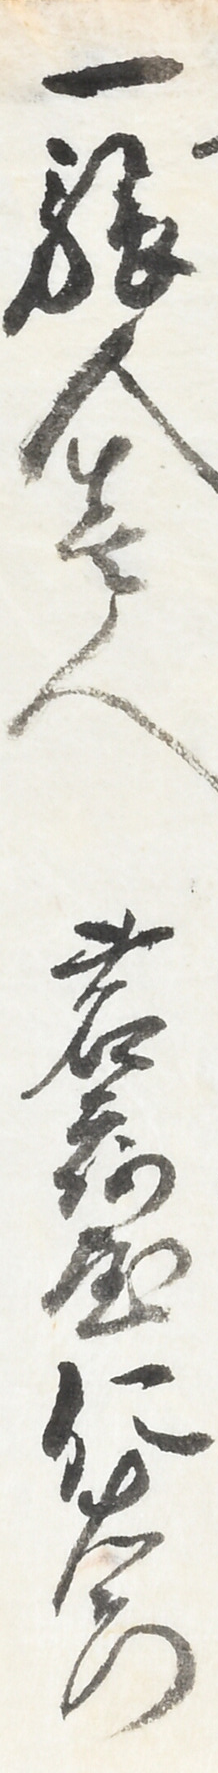一旅人壱人茗荷屋仁右衛門
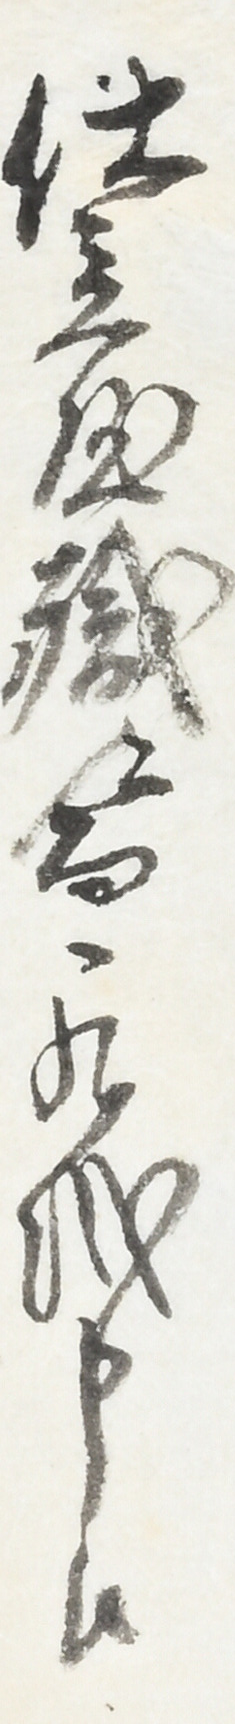仕立屋職ニ而罷越申候
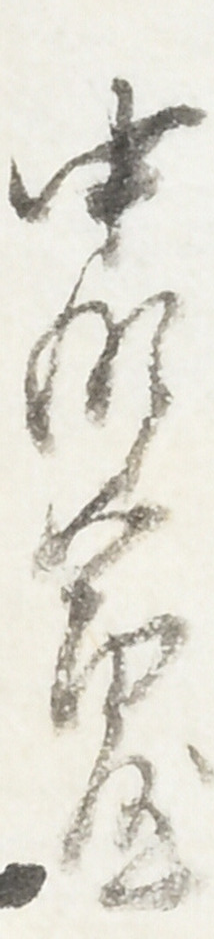中町冨屋
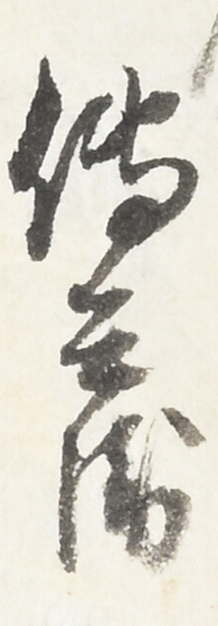伝兵衛

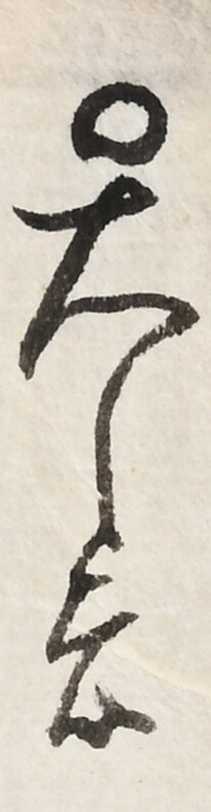〇右之者
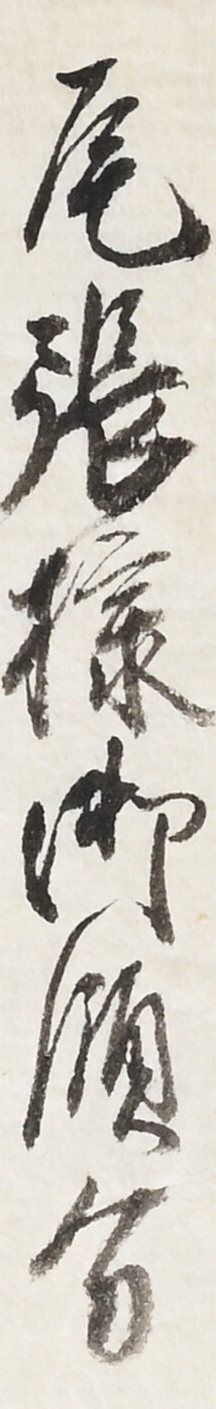尾張様御領分
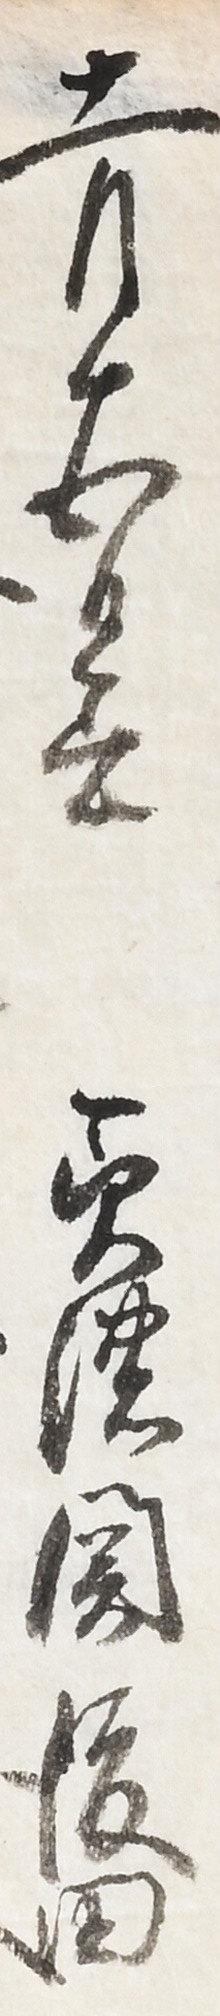十一月十五日着美濃関後田
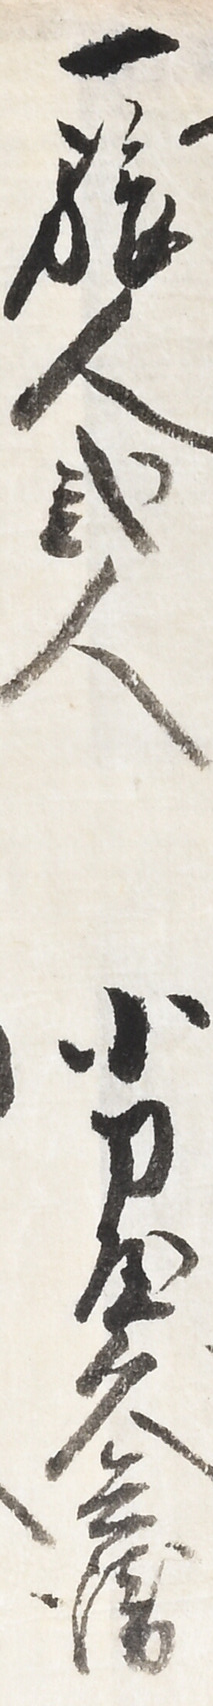一旅人弐人小刀屋久兵衛
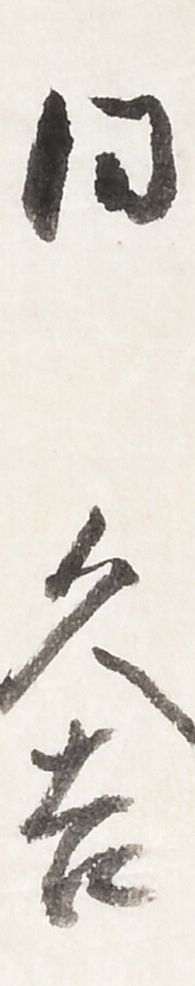同久吉
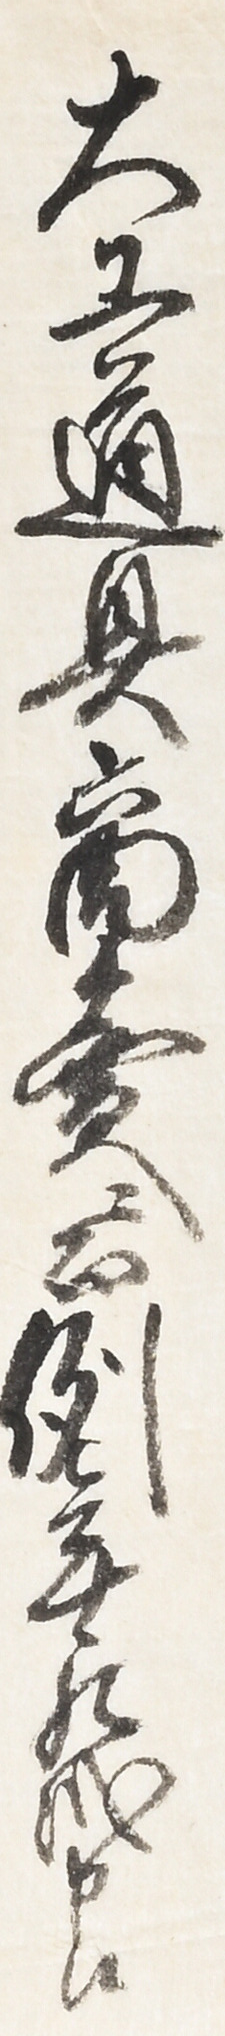大工道具商売ニ而例年罷越申候
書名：旅人泊控帳
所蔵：伊那市立高遠町図書館・合同会社AMANE
